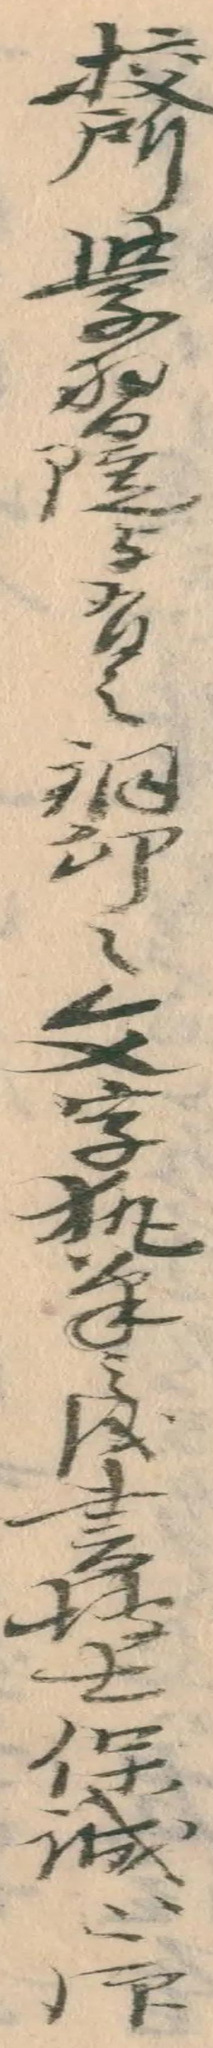校所學習院と有之調印之文字執筆之儀書博士保誠被仰
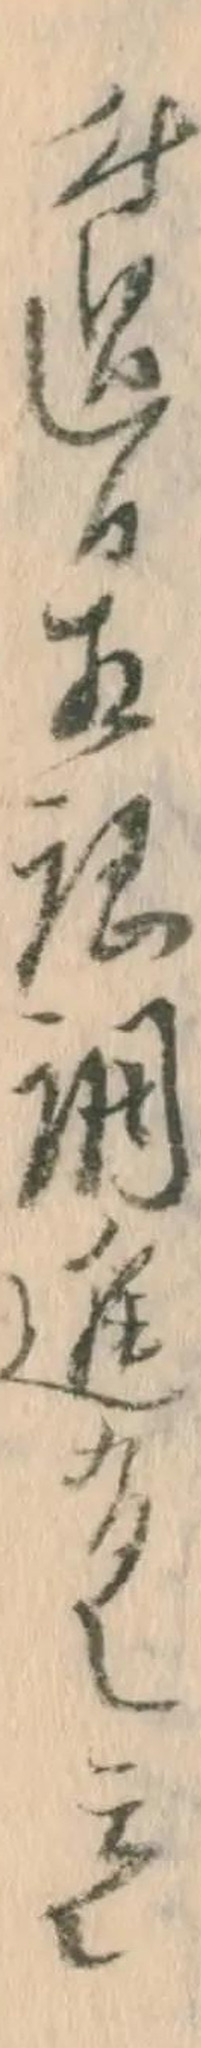付過日相認調進有之云々
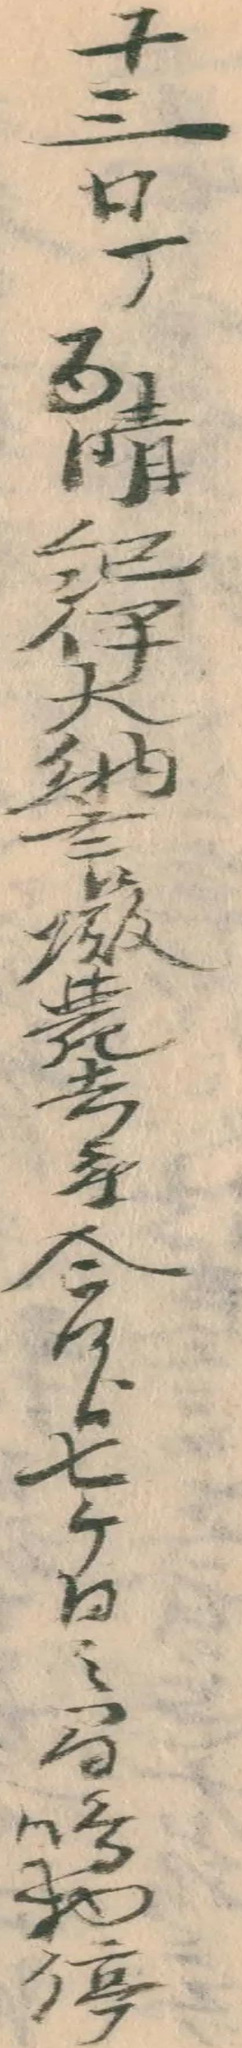十三日丁酉晴紀伊大納言殿薨去ニ付今日ゟ七ヶ日之間鳴物停
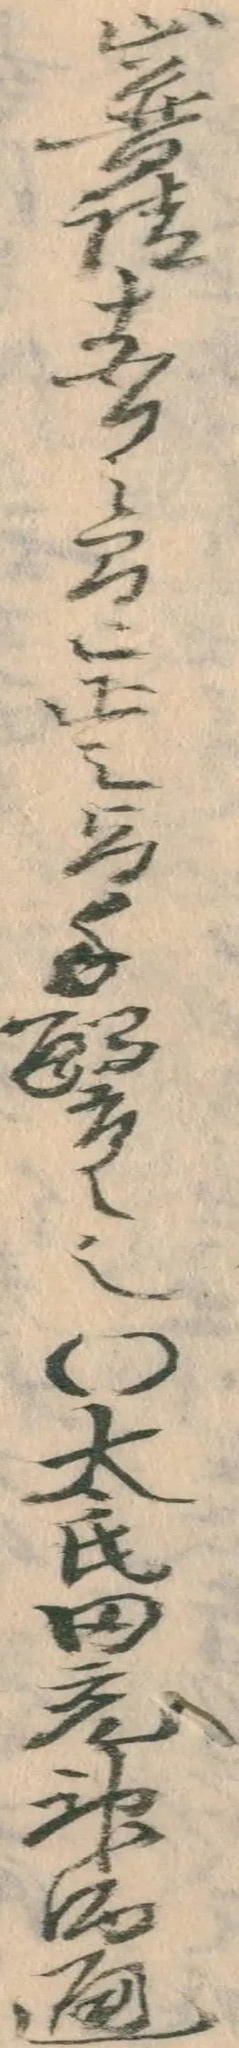止普請十五日之間被止之旨手觸有之也〇太氏田充神酒通
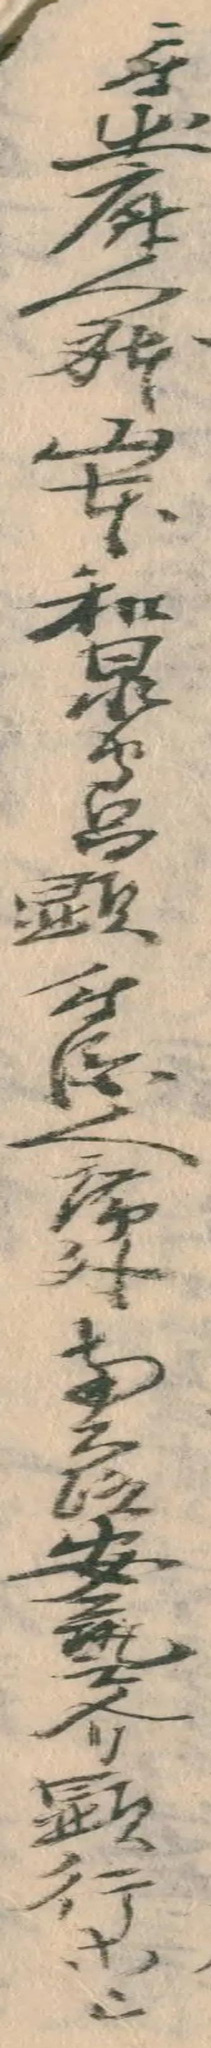二付出府人躰山本和泉守昌顕付添人席外南大路安藝介顕行等被
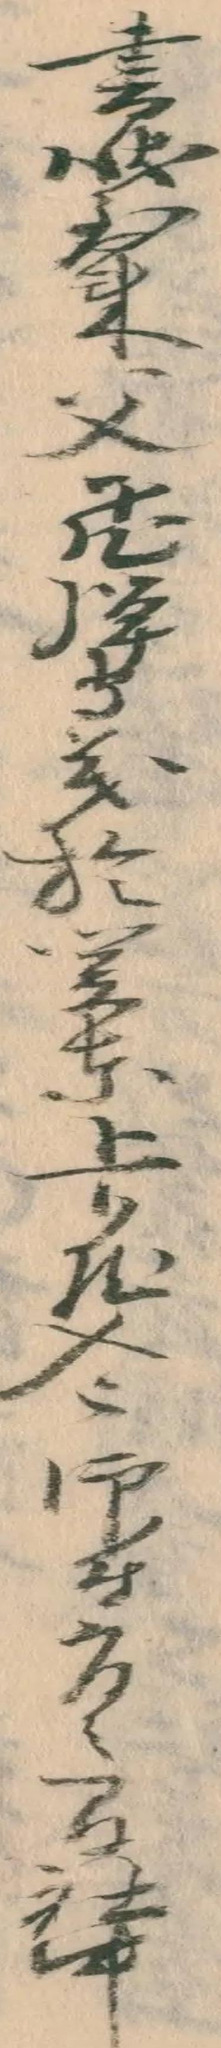書状到来父飛騨守義於関東上り屋入被仰付有之間社中
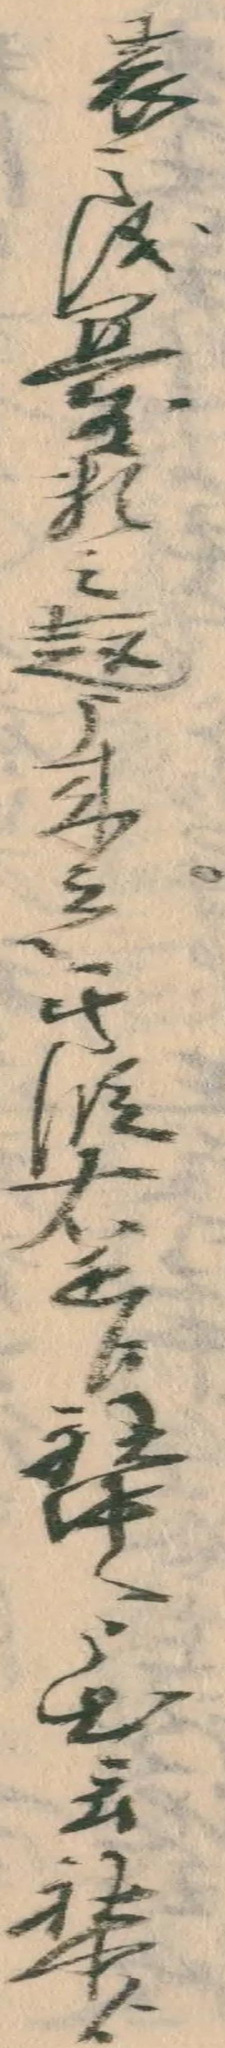表之儀宜敷頼之趣申来云々其段右近日社中へ申出ニ付社中ゟ
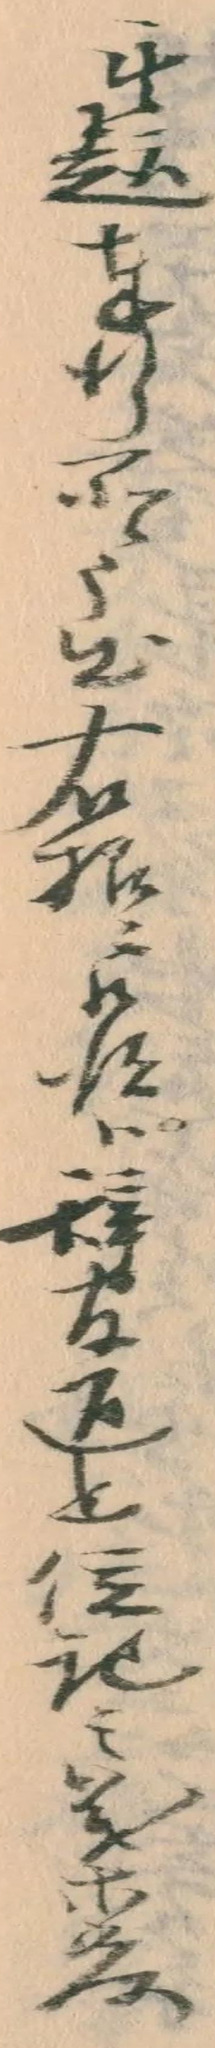其趣奉行所に申出右様に候得ハ辞官返上位記之義等差
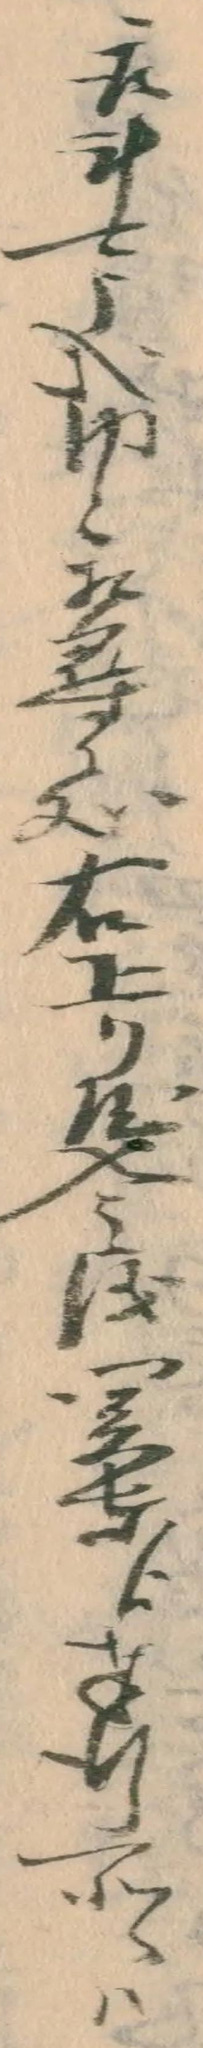取斗可申哉内々相尋候処右上り屋入之儀関東ゟ奉行所へハ
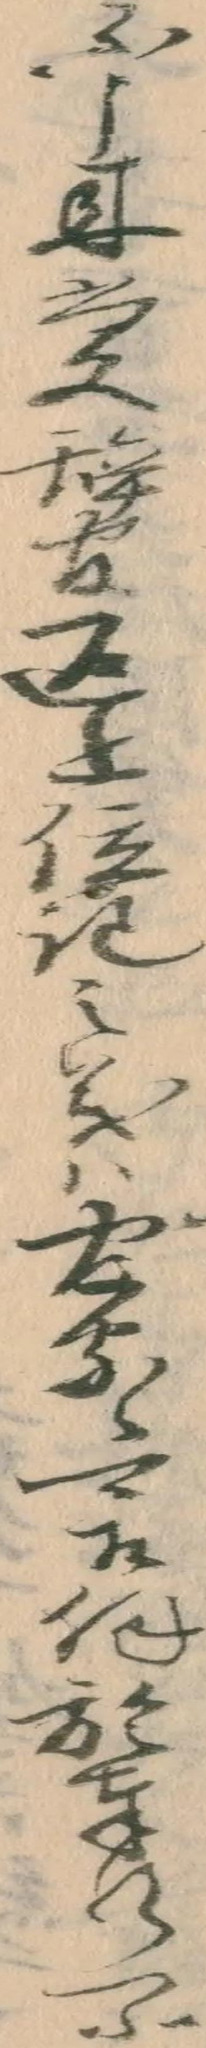不申来尚又辞官返上位記之義ハ官家へ可相伺於奉行所
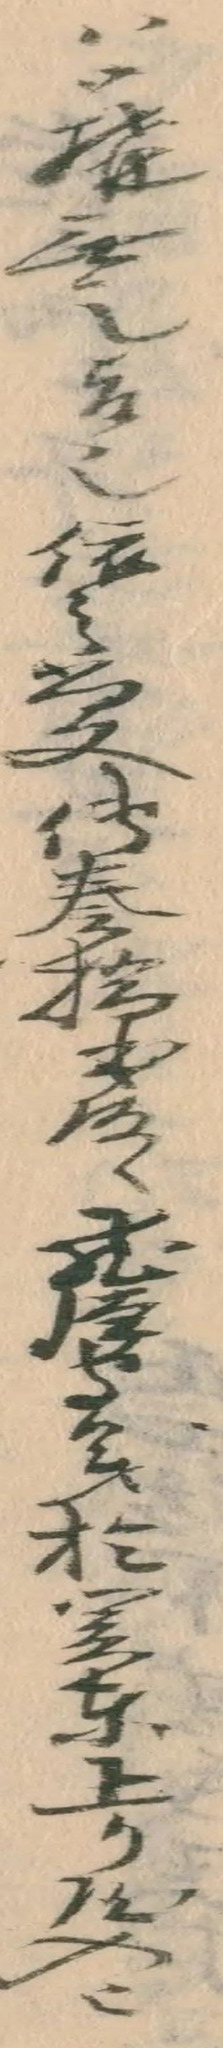ハ御構無之旨也依之尚又傳奏橋本殿へ飛騨守義於関東上り屋入被
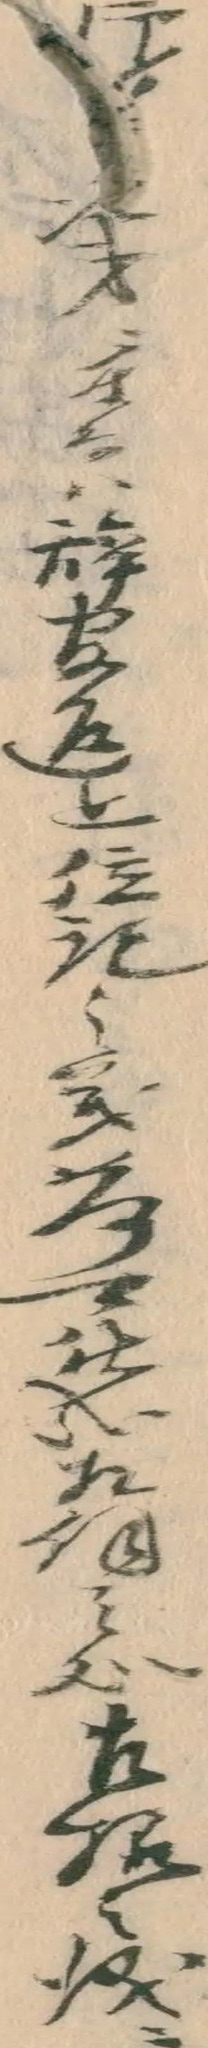仰次第ニ候而ハ辞官返上位記之義如何可仕哉相伺之処左様之儀ニ
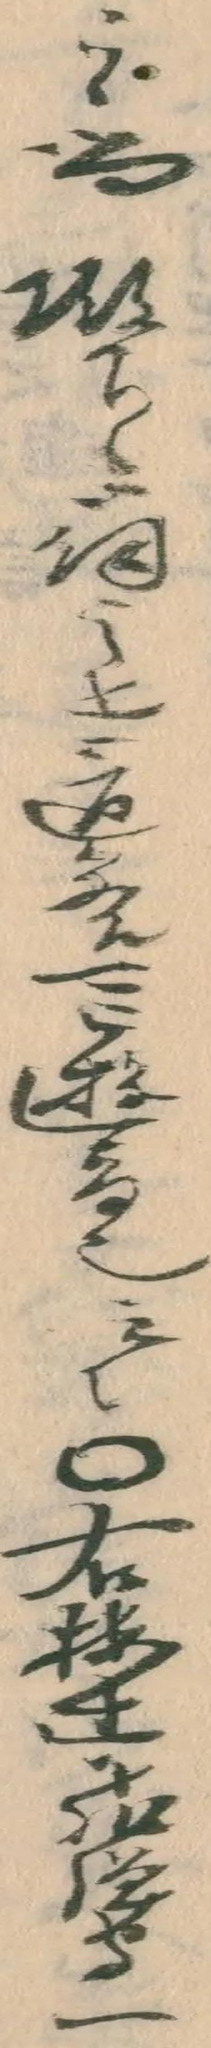被下尚殿下ヘ御伺之上ニ返答可被遊旨也云〻〇右梅辻飛騨守一
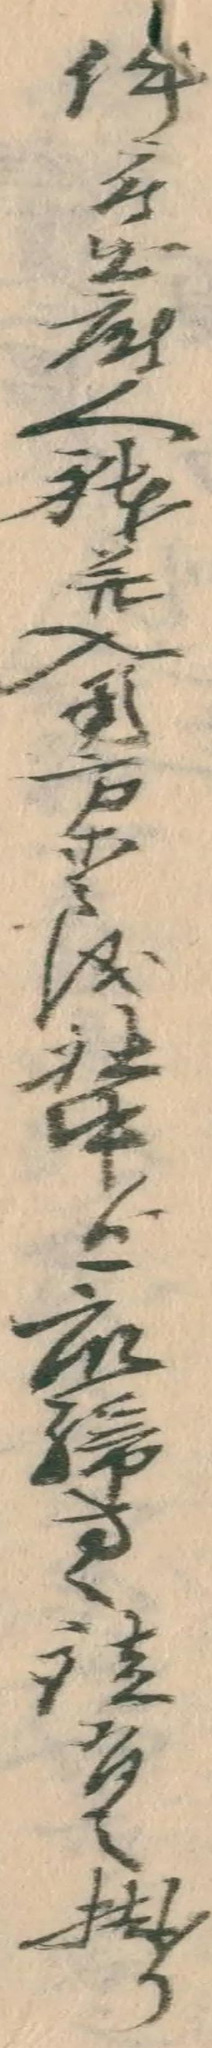件ニ付出府人躰并入用方等之儀荘中ゟ御取締方へ請有之掛り
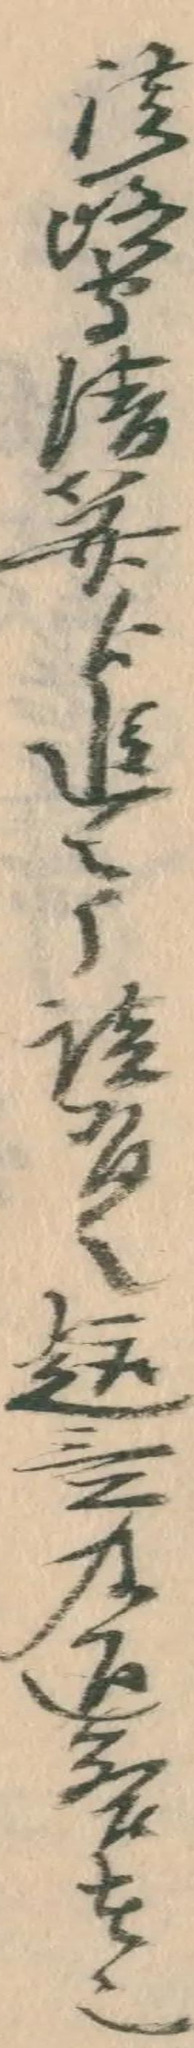淡路守清算ゟ追々申談有之趣意及返答者也
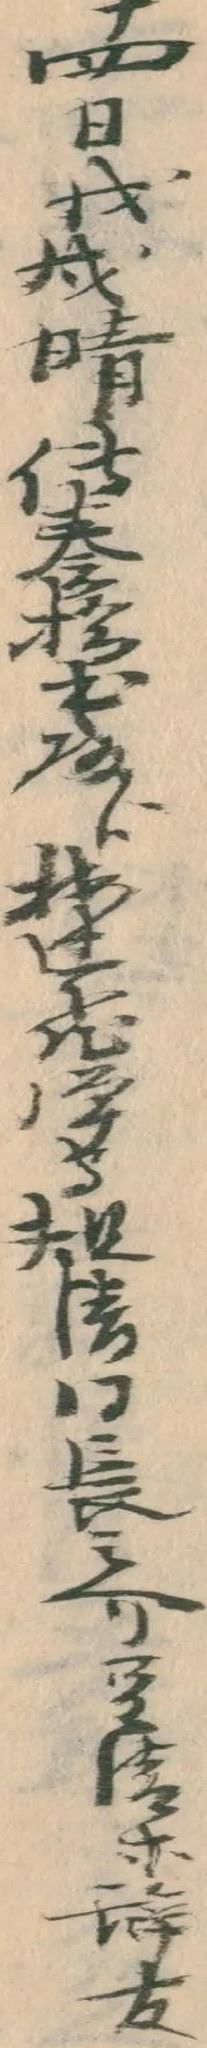十四日戊戌晴傳奏橋本殿ゟ梅辻飛騨守規清同長之介呈清等辞友
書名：賀茂社記録. 第70冊
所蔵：国立国会図書館 National Diet Library, JAPAN
